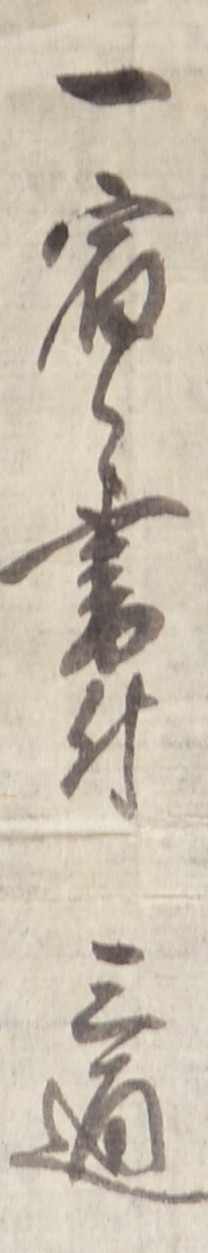一宿之書付三通
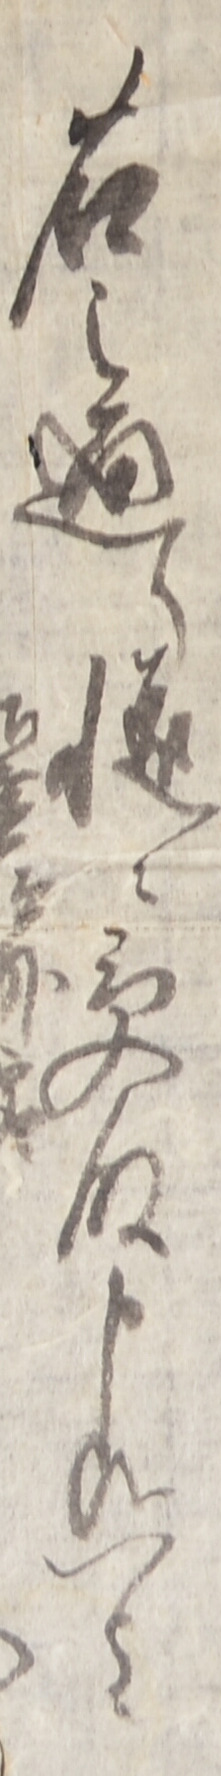右之通り慥ニ受取申候以上
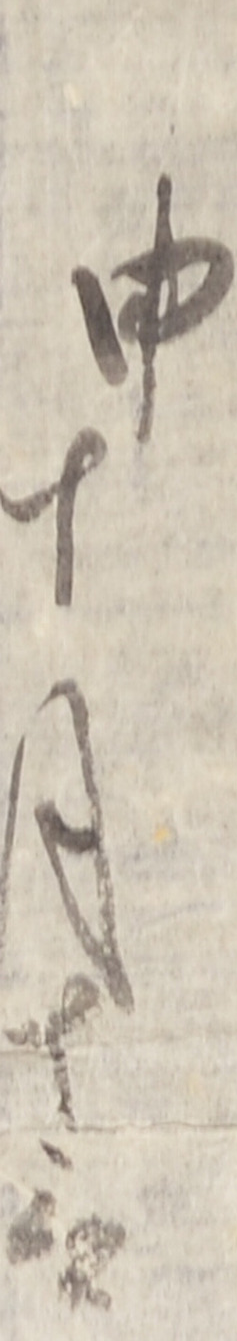十月十三日
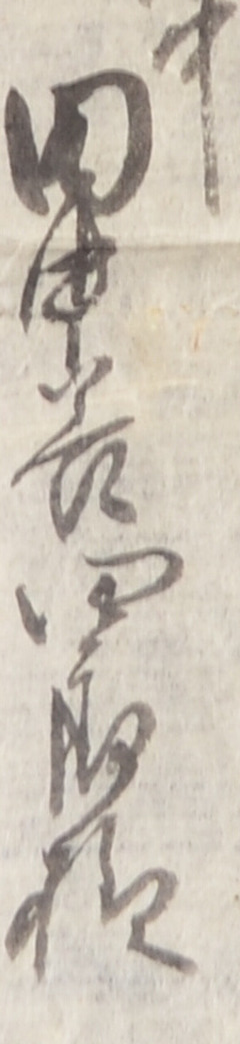田中善四助様
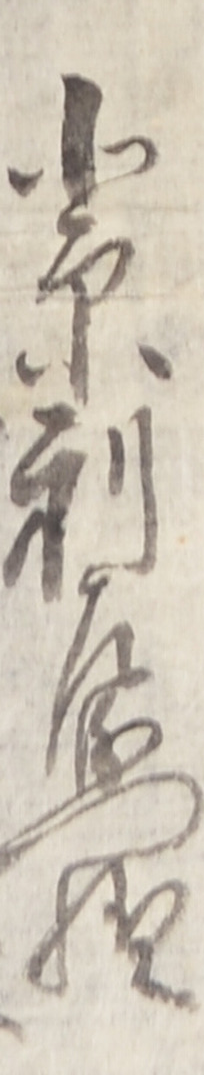北原利左衛門様
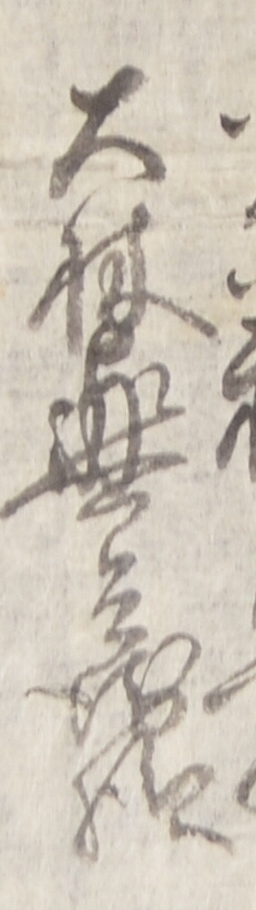大林与兵衛様
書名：覺
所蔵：伊那市立高遠町図書館・合同会社AMANE
